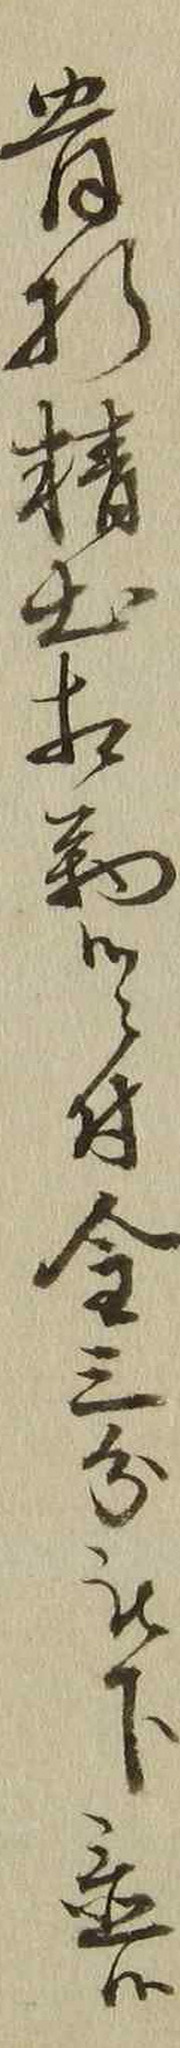骨折精出相勤候ニ付金三分被下置候
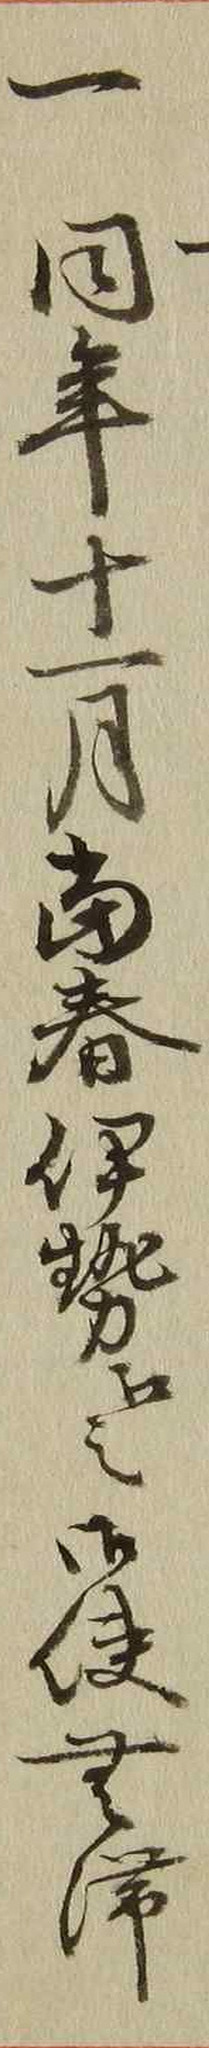一同年十一月当春伊勢江之御使無滞
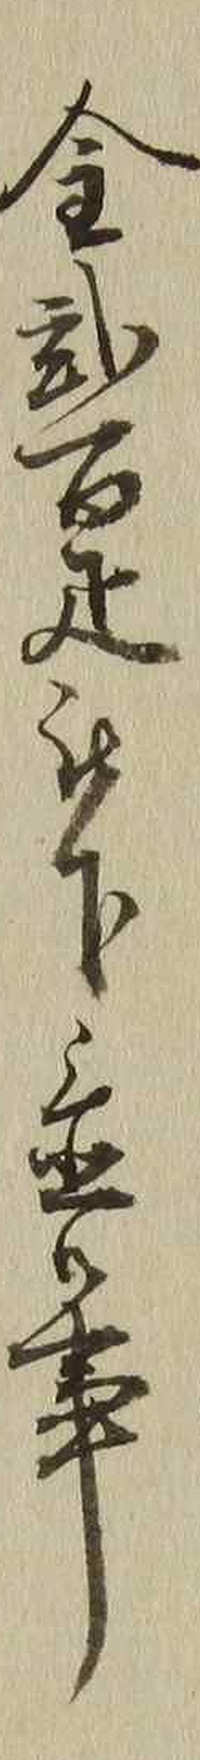金弐百疋被下置候事
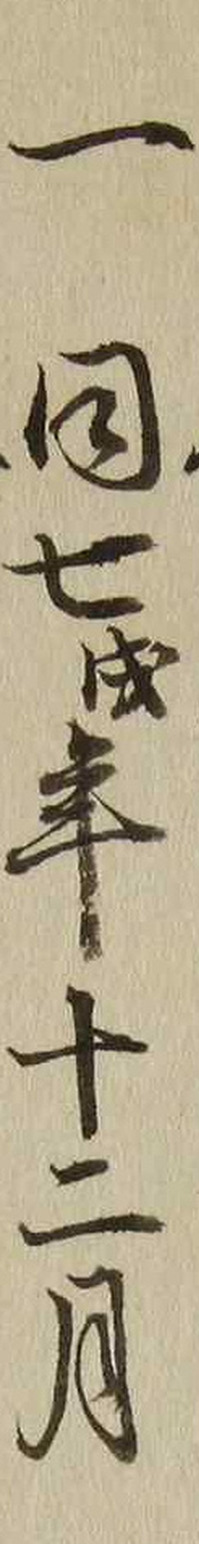一同七戌年十二月
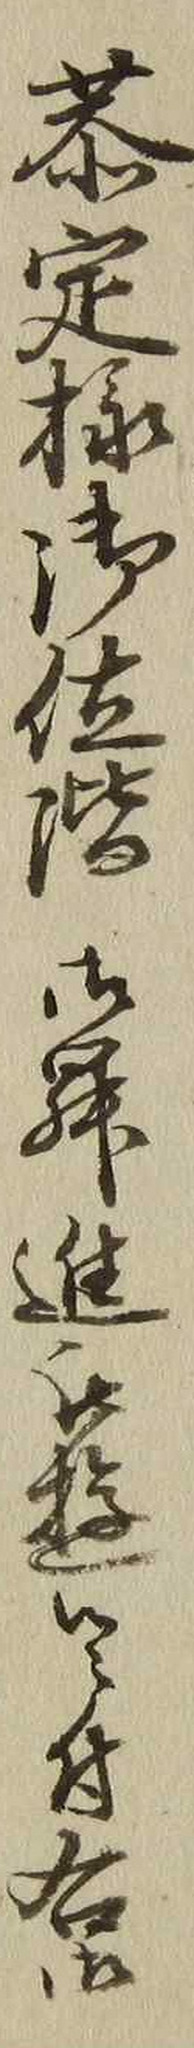恭定様御位階御昇進被遊候ニ付右御
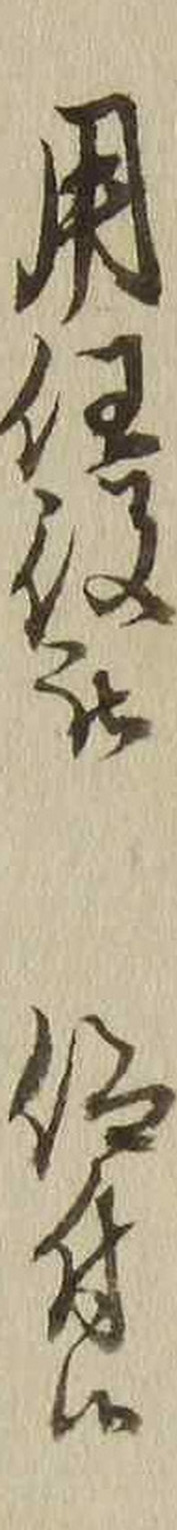用任役被仰付候
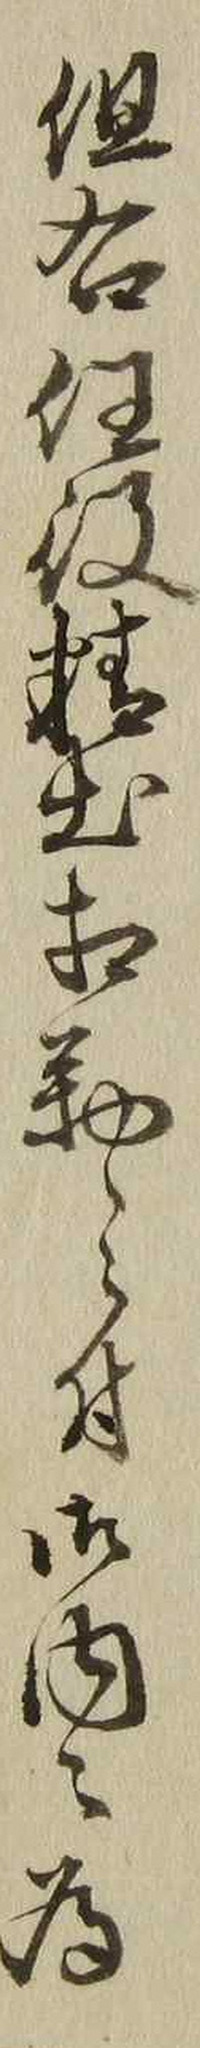但右任役精出相勤候ニ付御内々為
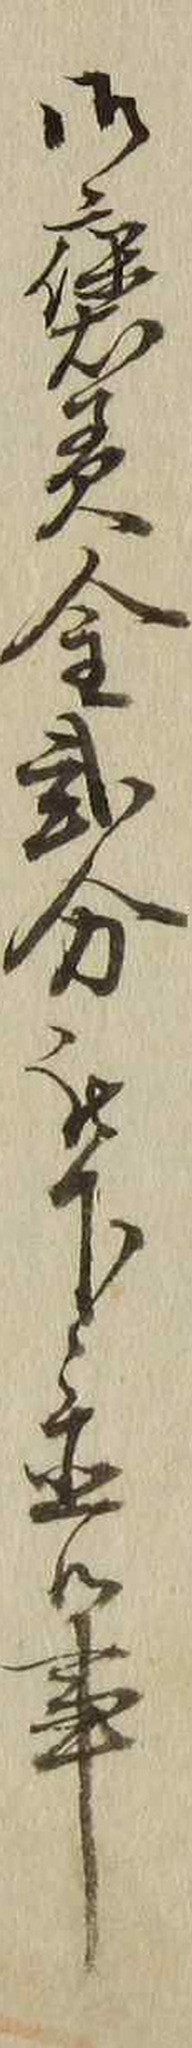御褒美金弐分被下置候事
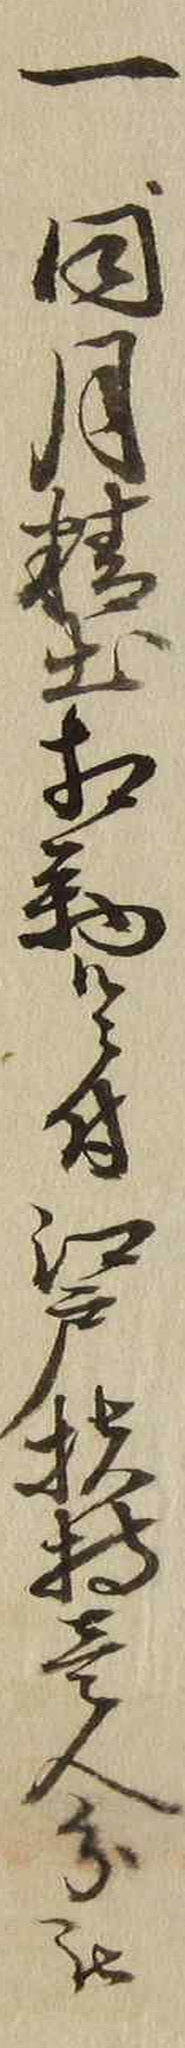一同月精出相勤候ニ付江戸扶持壱人分被
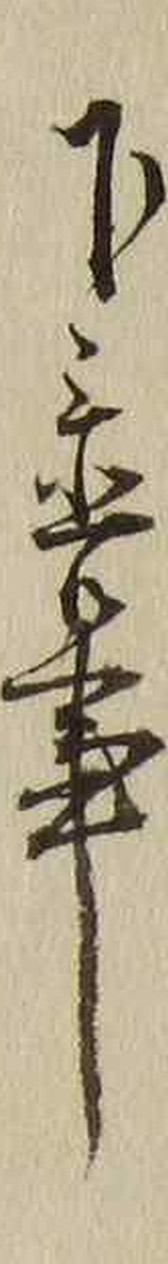下置候事
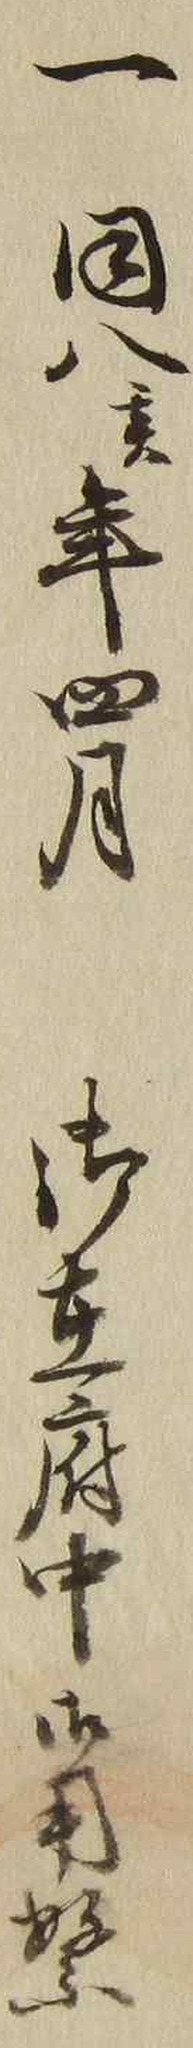一同八亥年四月御在府中御用繫

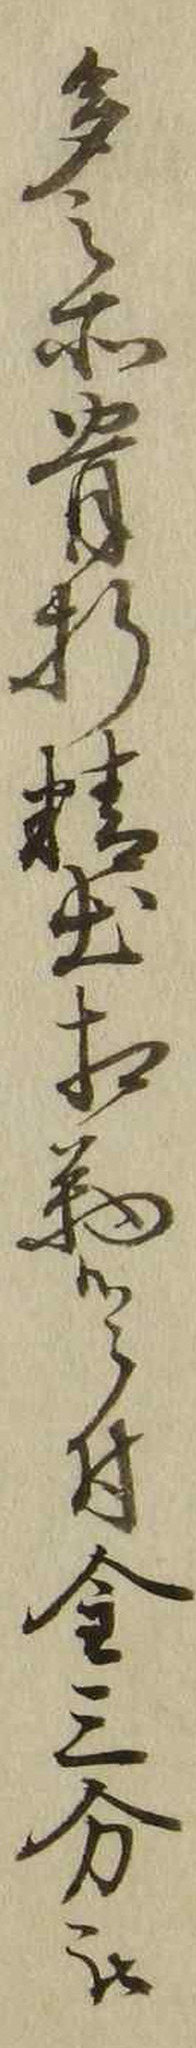多之所骨折精出相勤候ニ付金参分被
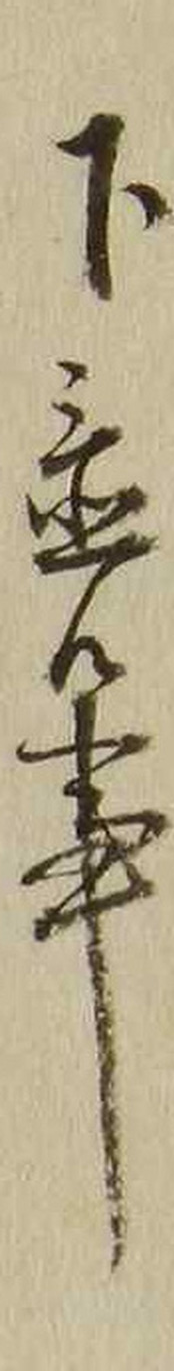下置候事
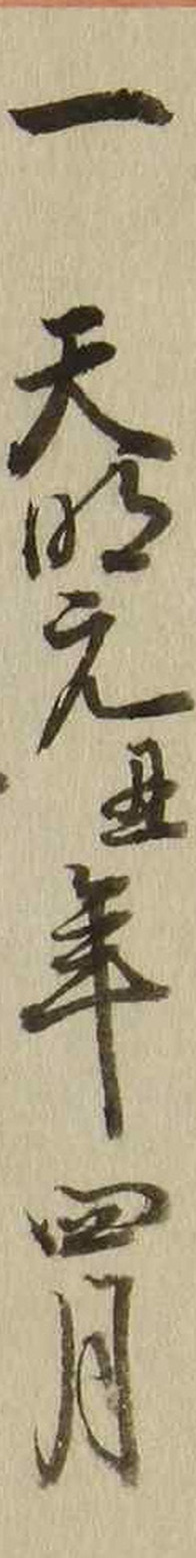一天明元丑年四月
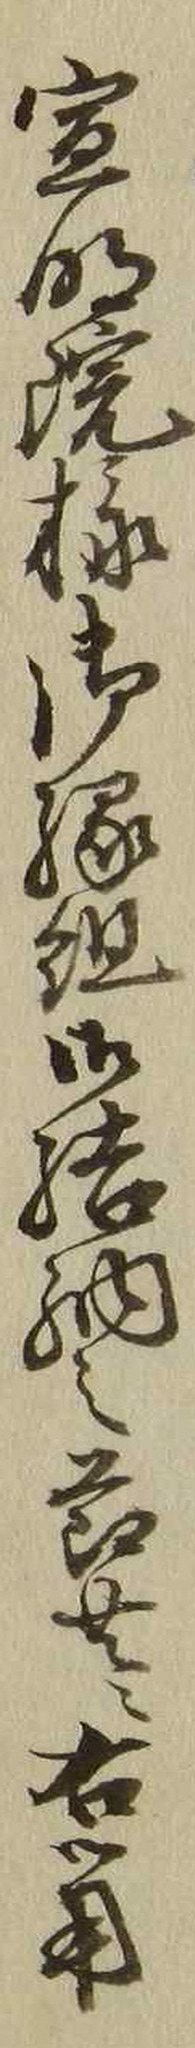宣明院様御縁組御結納之節供ニ右御用
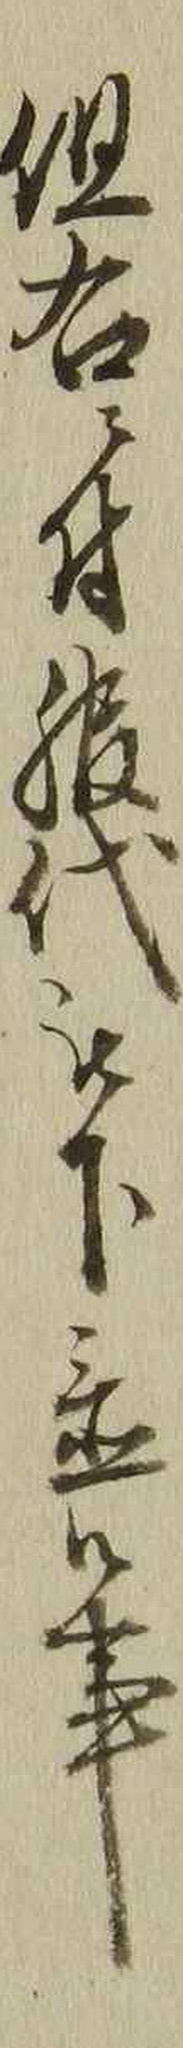但右ニ付服代被下置候事
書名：諸士系譜　巻之64　と之部7
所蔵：会津若松市立会津図書館
